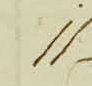11
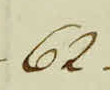62
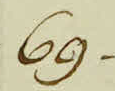69
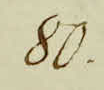80
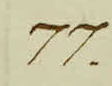77
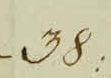38
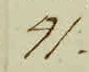41
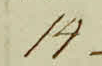14
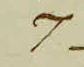7
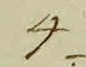4
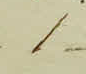1
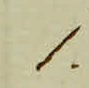1
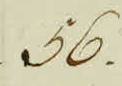56
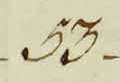53
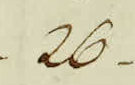26
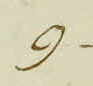9
